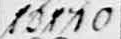13170
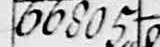66805
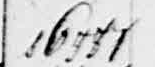16757
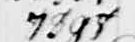7395
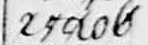25206
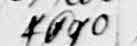4630
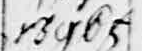13965
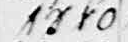1310
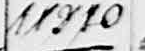11310
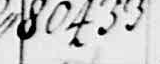80433
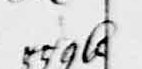55969
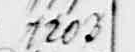7203
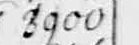3900
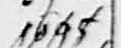1645
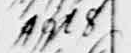1918
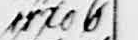11206
